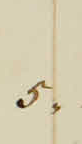5
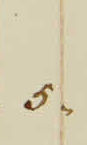5
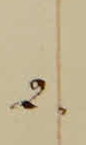2
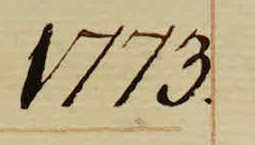1773.
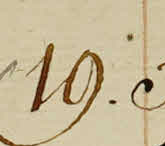19.
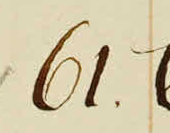61.
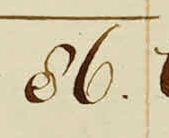86.
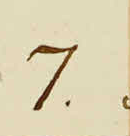7.
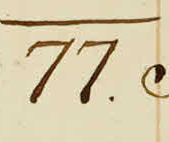77.
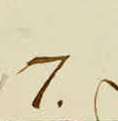7.
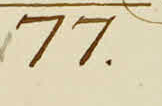77.
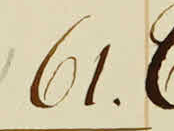61.
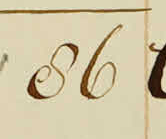86
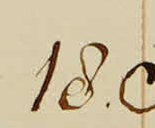18.
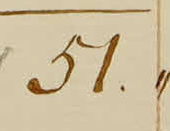51.
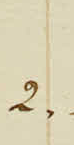2
